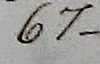67
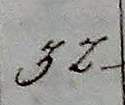32
